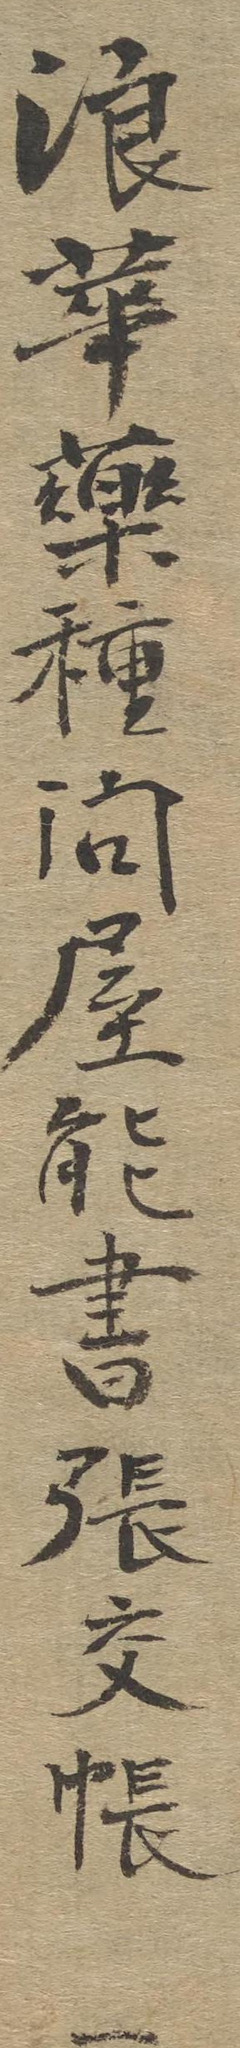浪華藥種問屋能書張交帳一

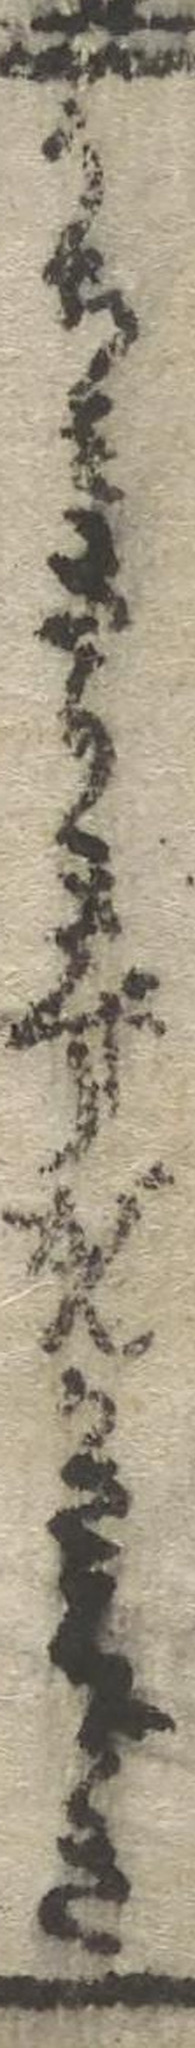うちみきりきずさがんかさくじき
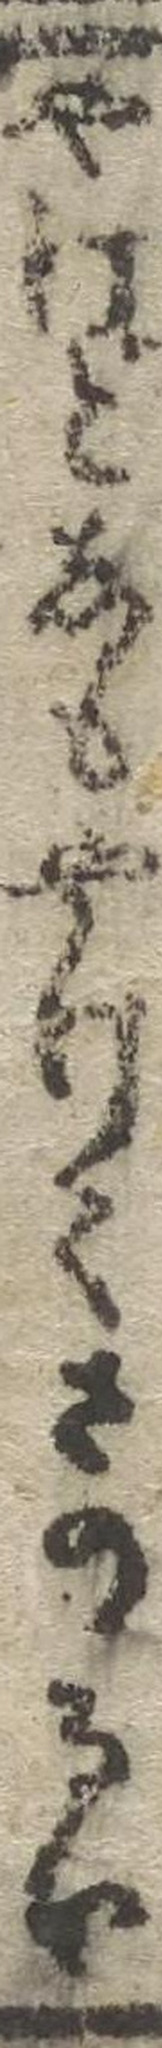やけどしもやけくさのるい
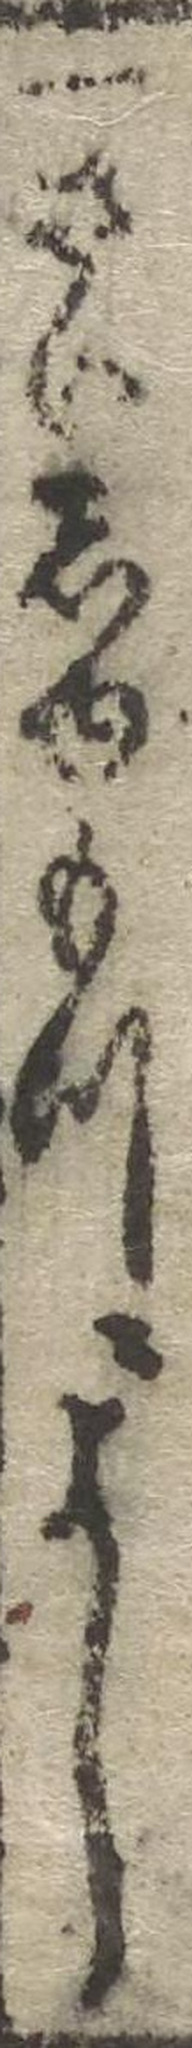一さいしゆもつによし
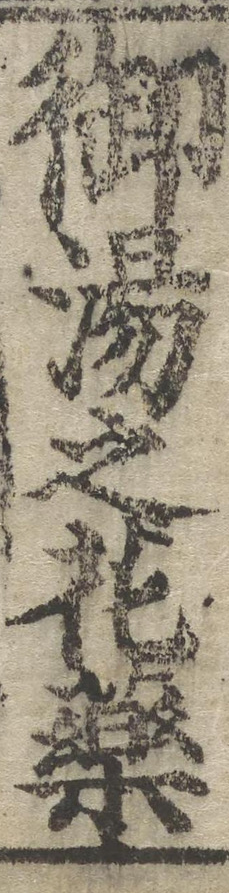御湯之花薬
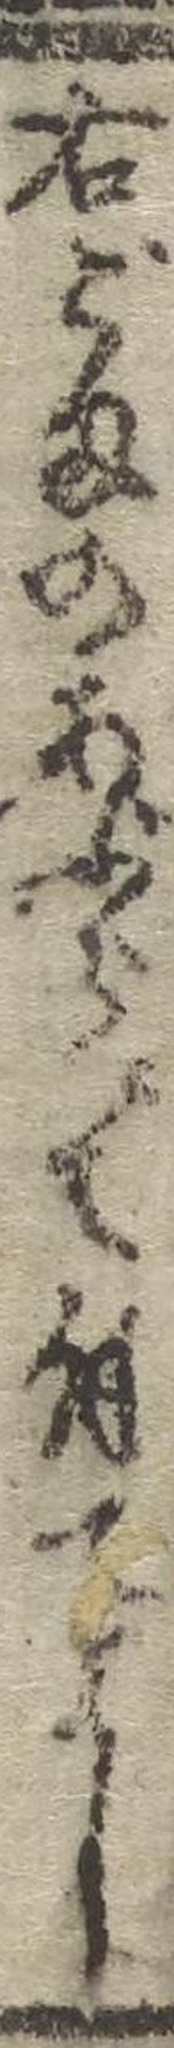右ごまのあぶらにて付てよし
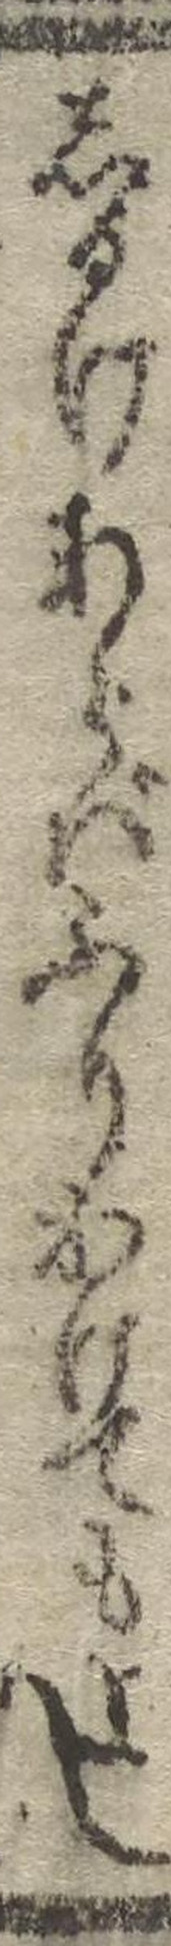しるけあらばふりかけてもよし
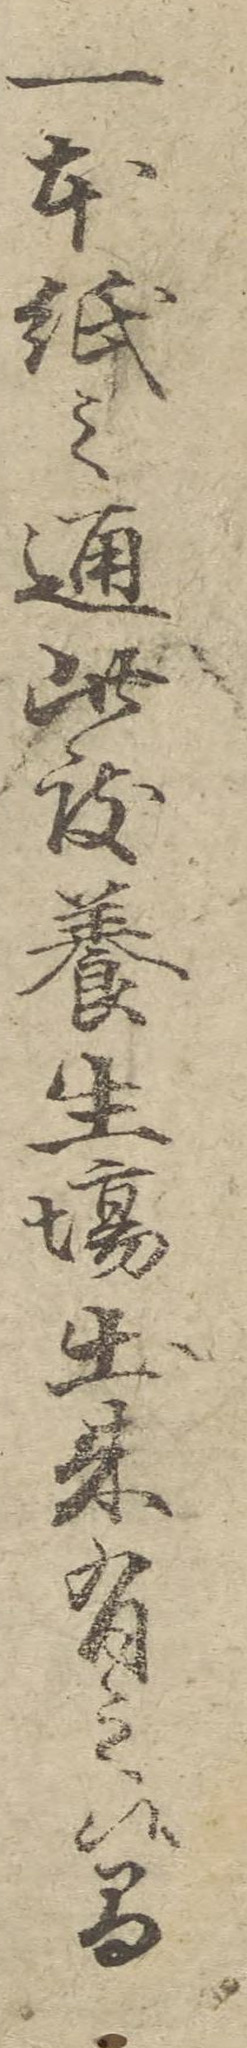一本紙之通此度養生場出来有之候間
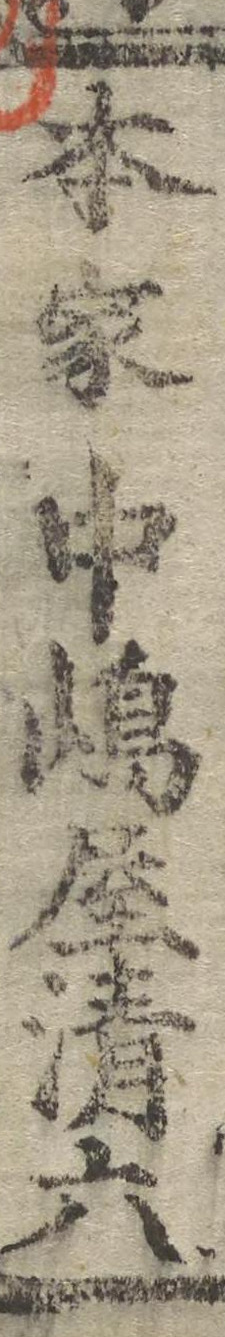本家中嶋屋清六
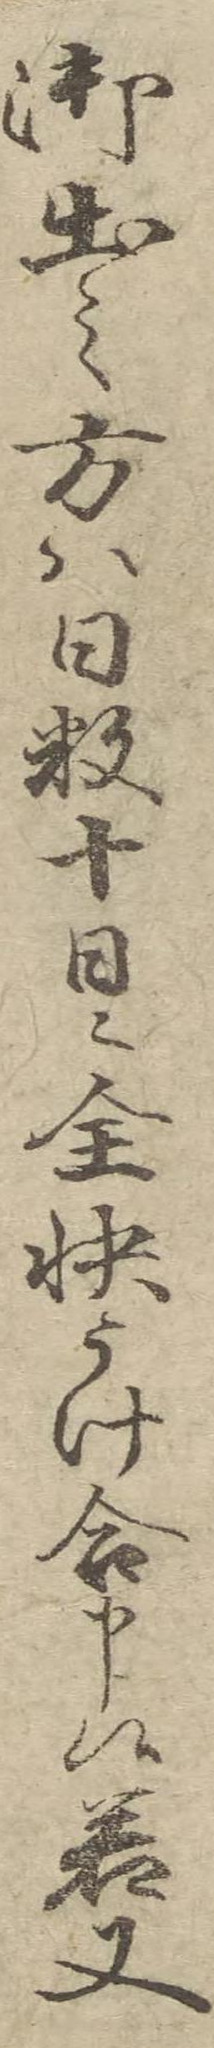御出之方は日数十日に全快うけ合申候若又
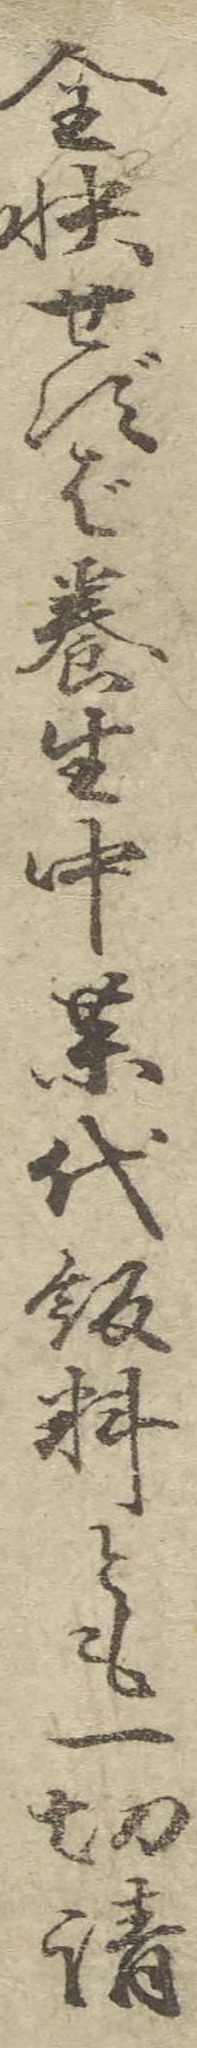全快せずば養生中薬代飯料とも一切請
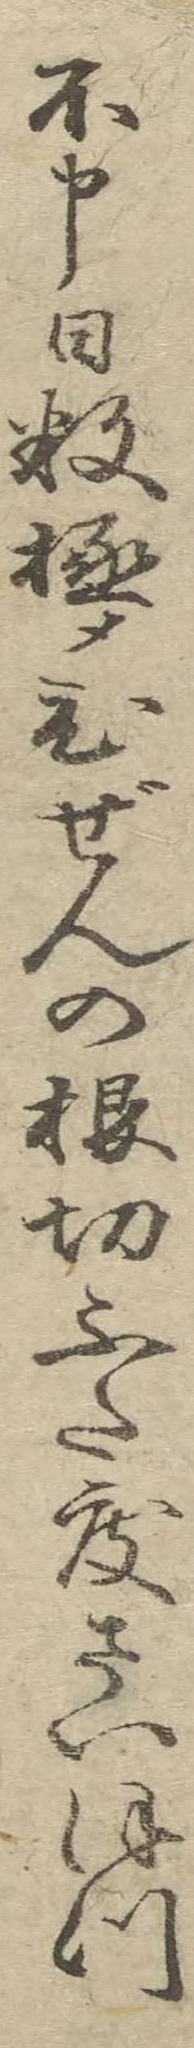不申日数極めひぜんの根切ふた度さいほつ
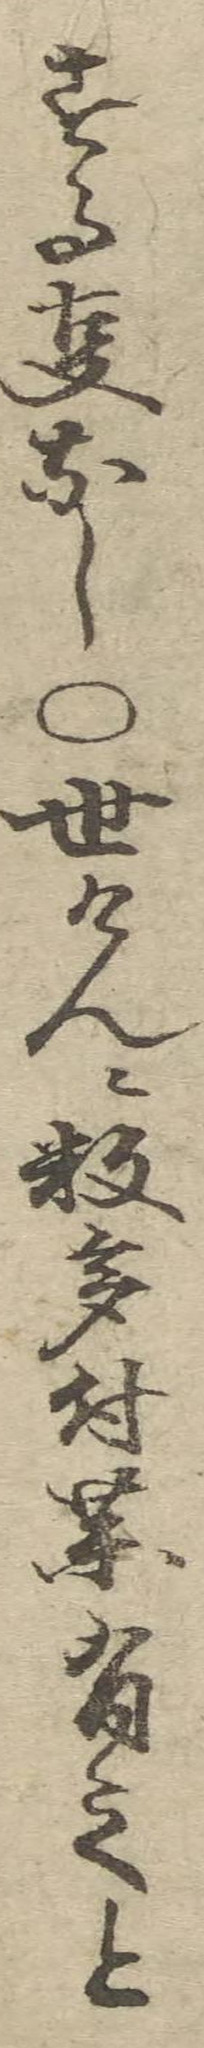する事なし○世けんに数多付薬有之と
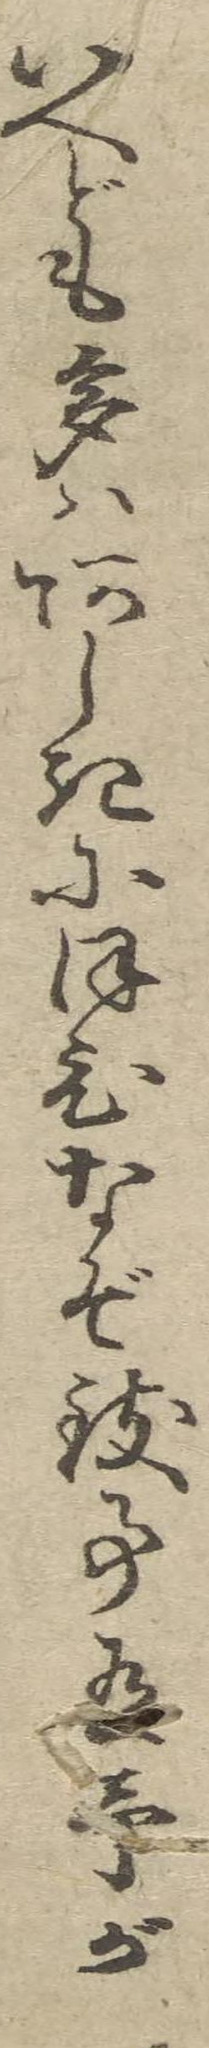いへども多はあしきにほひなぞ致事有予が
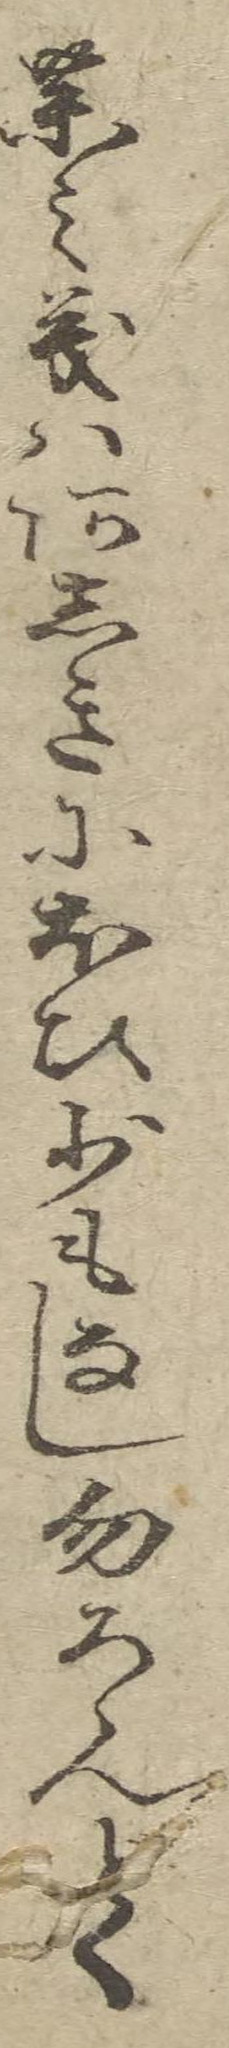薬之義はあしきにほひ少もなし勿ろんとく
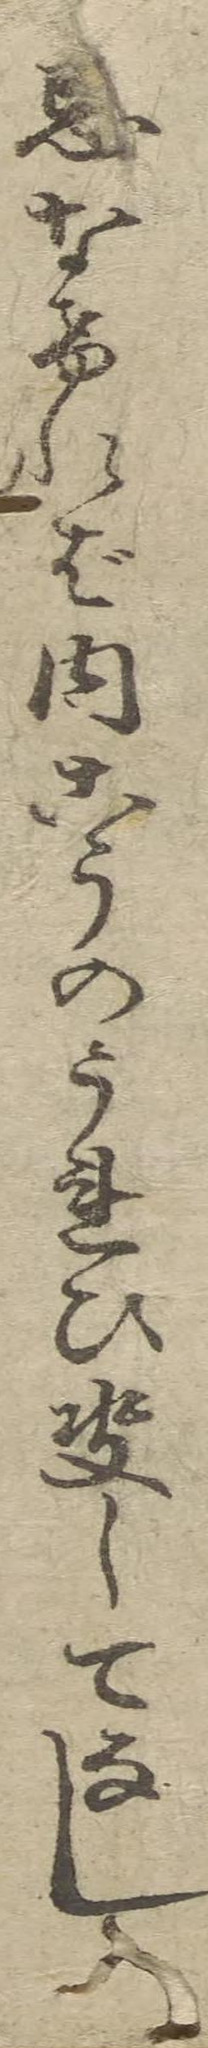思なければ内こうのうれひ決してなし
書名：浪華薬種問屋能書張交帖. 一
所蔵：国立国会図書館 National Diet Library, JAPAN
